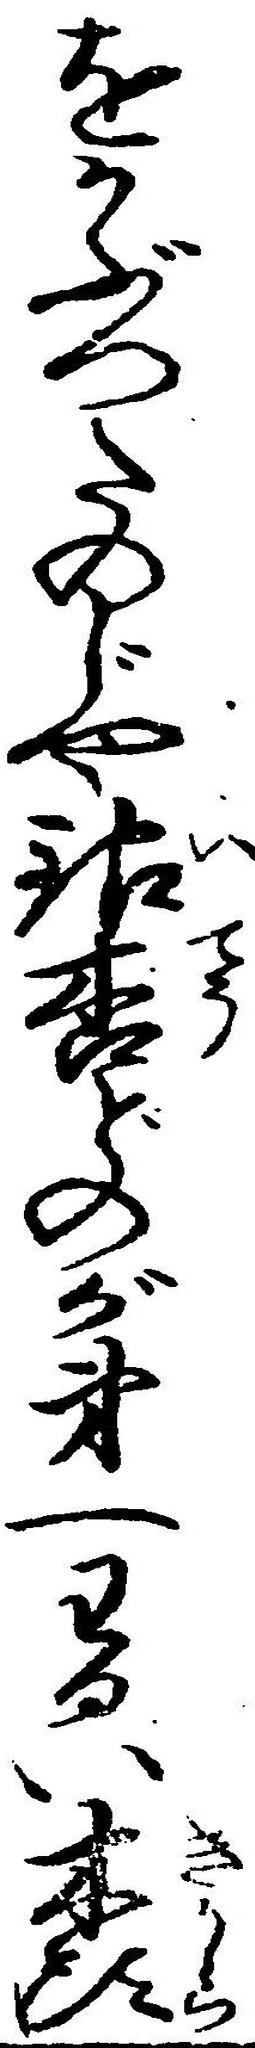をかぶつたのじや銀杏どのが第一わるい木頭
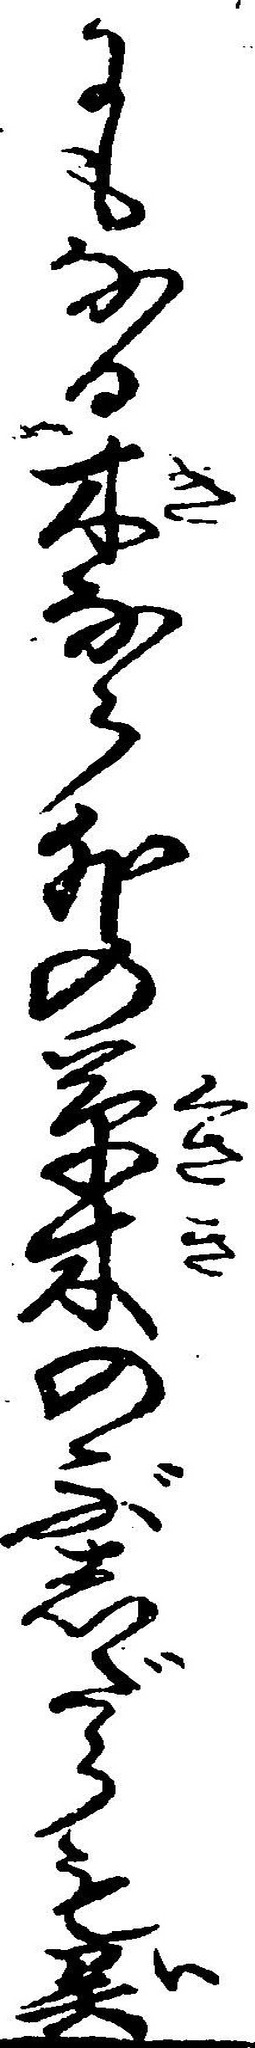にもなる木なら外の草木のぶしだらも異
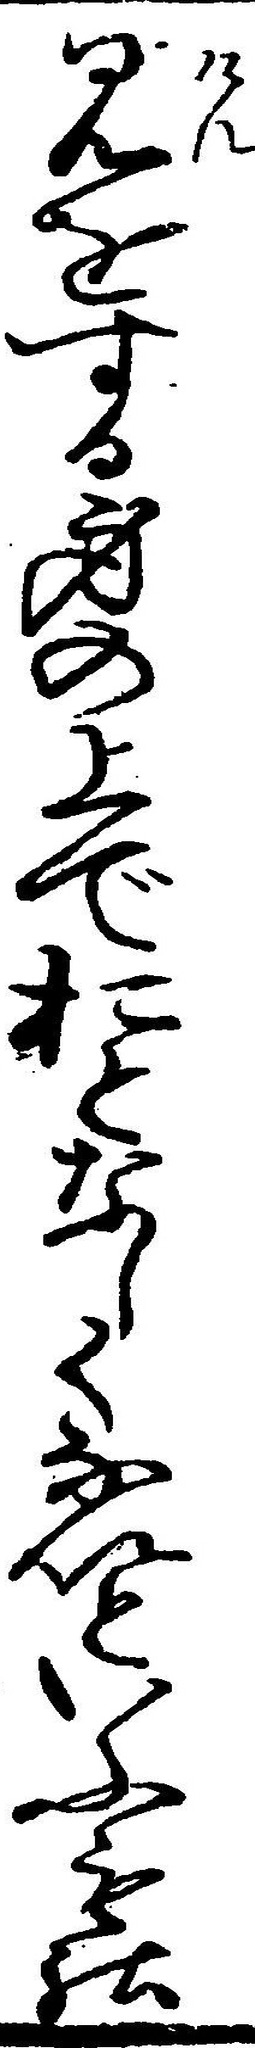見をする身の上でおとなしくないといふもの

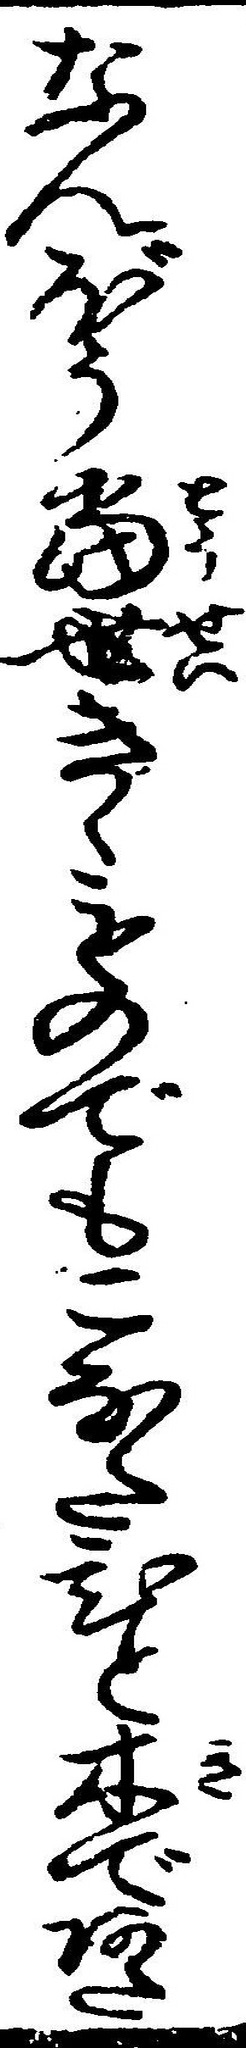なんぼう当世きゝものでもこなたひと木であた
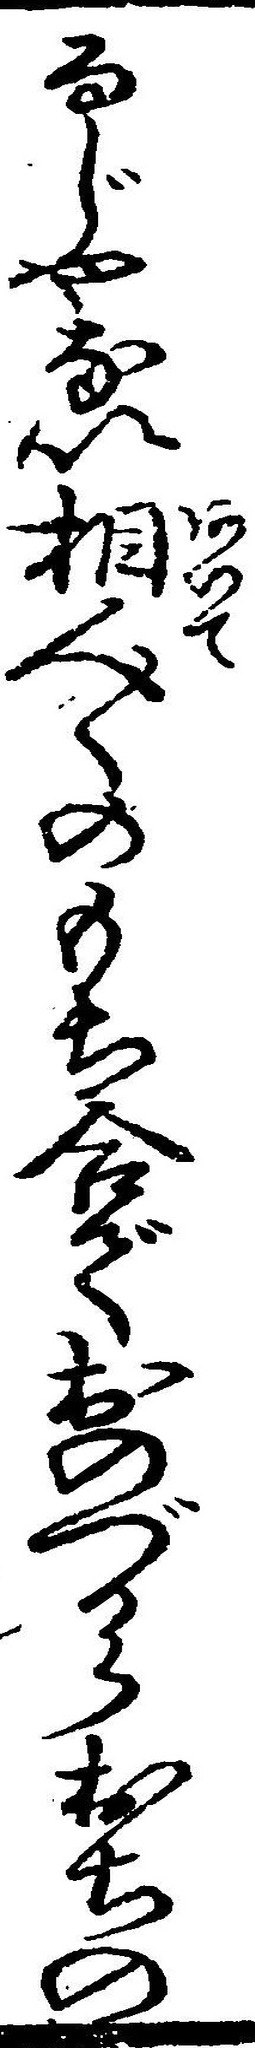るじやない相人〳〵のもち合でおのづからおちの
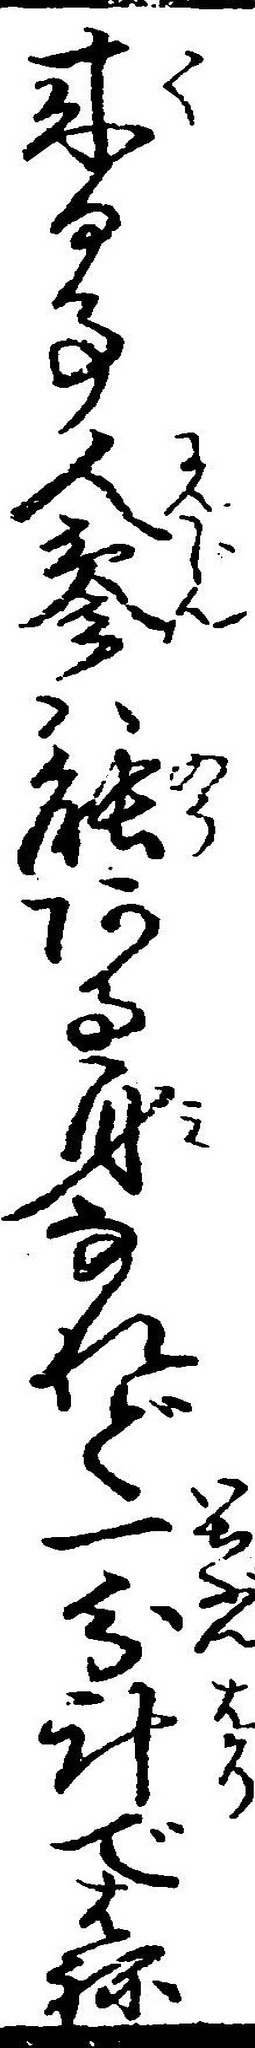来る事人参は能ある身なれど一分計ではね
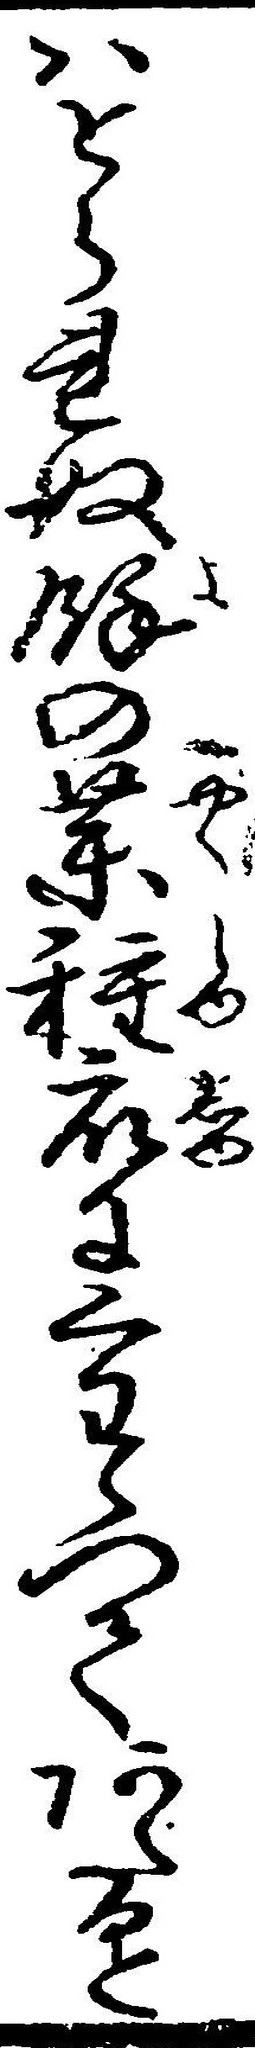はとられぬ余の薬種衆にくわゝつてあたると
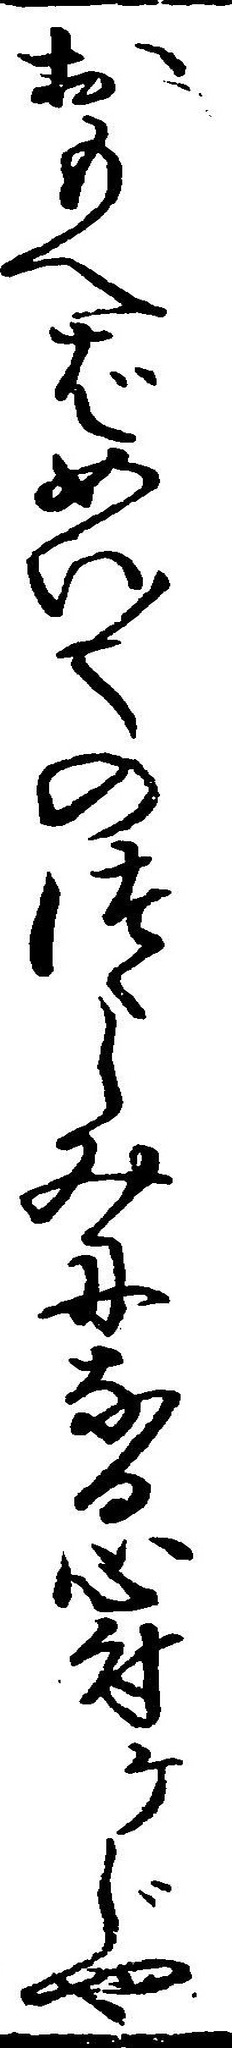おもへばめい〳〵のつゝしみになる心付じや
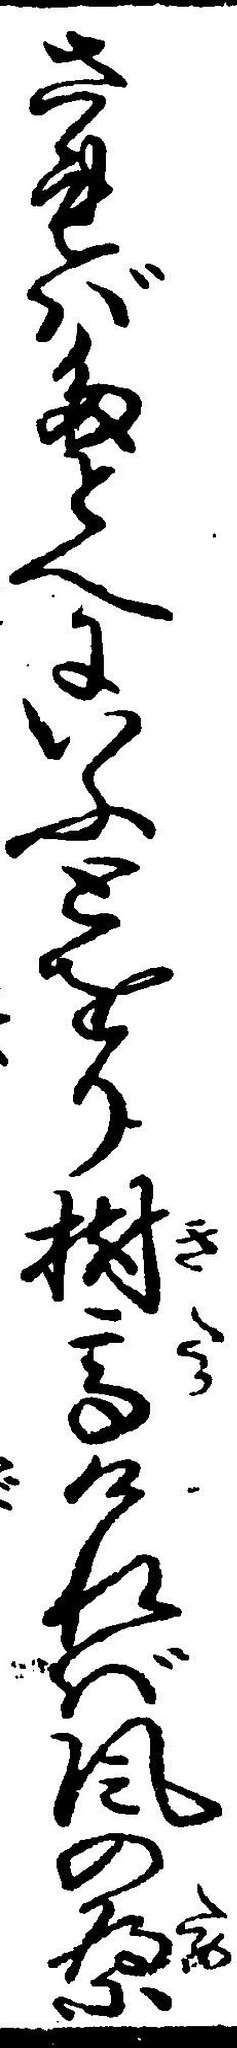さればたとへにいふとをり樹高ければ風の為に
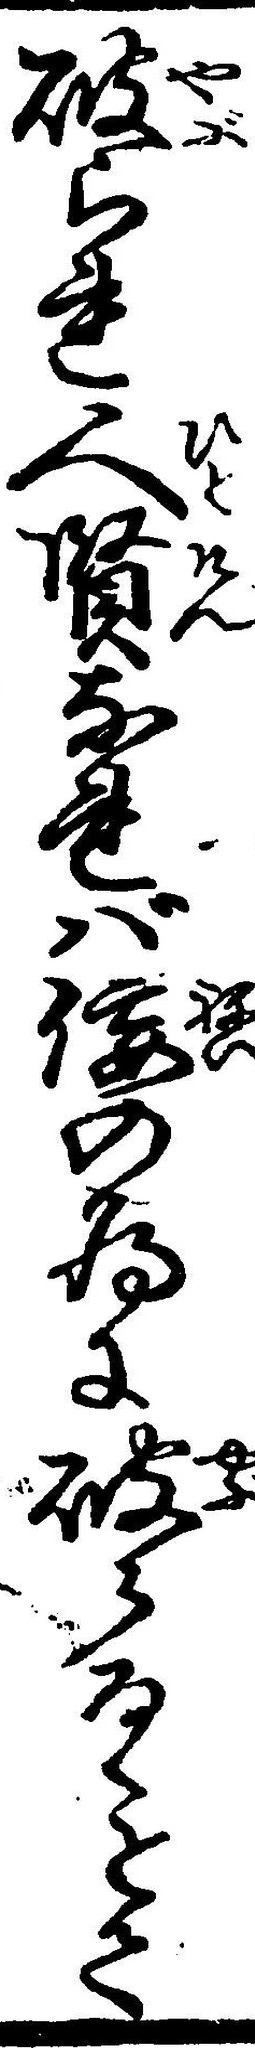破られ人賢なれば侫の為に破らるゝとて
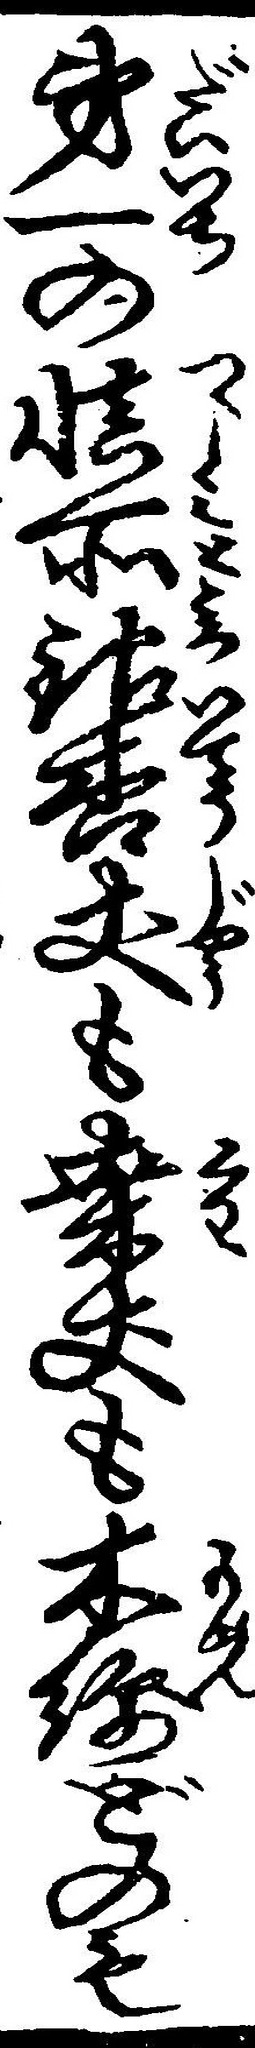第一の慎所銀杏丈も桑丈も木綿どのも
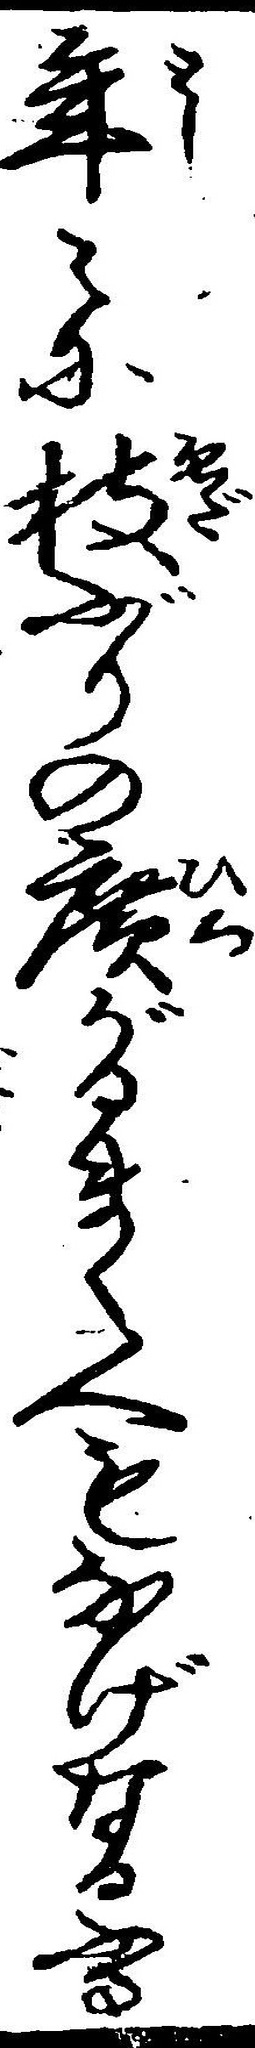年々に枝ぶりの広がるまゝ人もなげなるふる
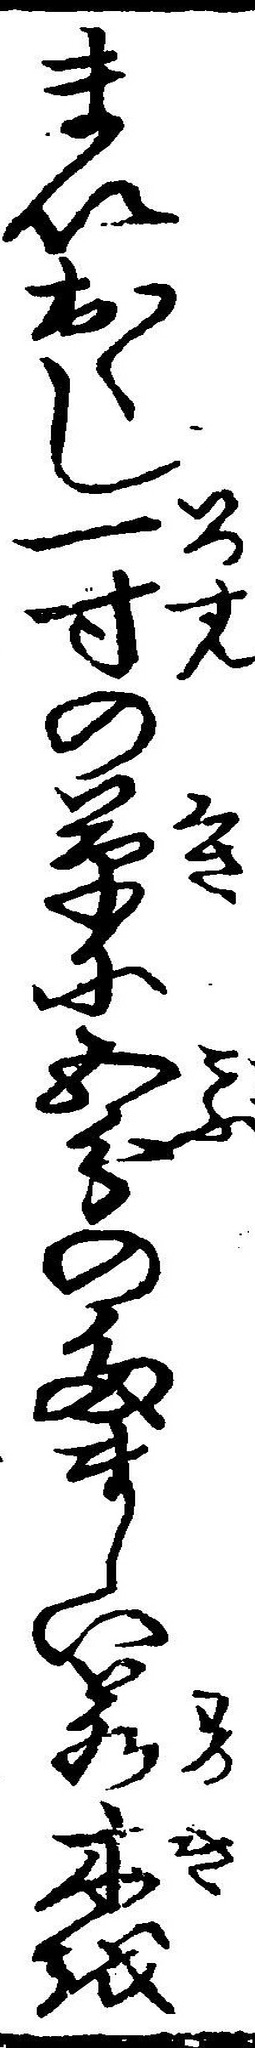まいおゝし一寸の草に五分のたましい若木を
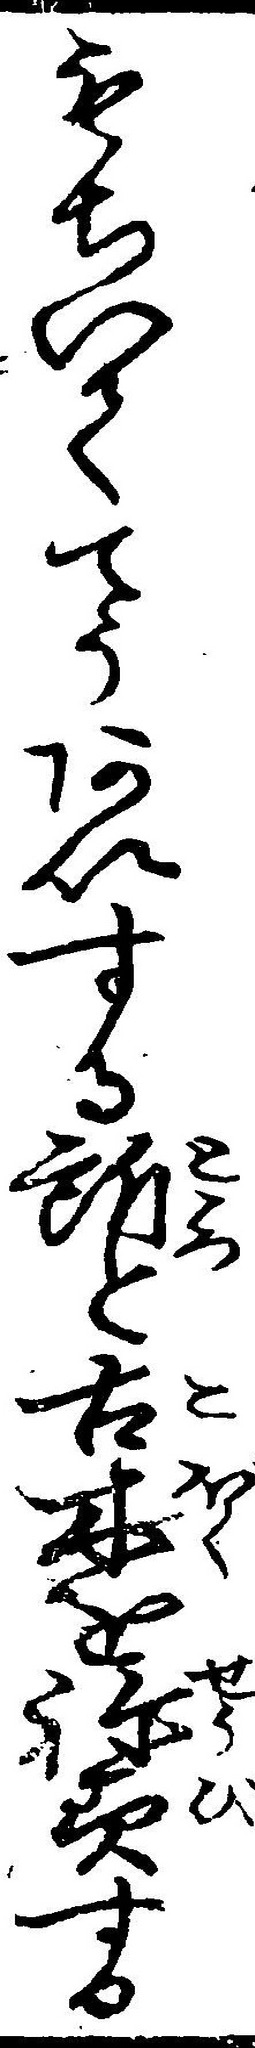もちいててうあいする所と古木を称美する
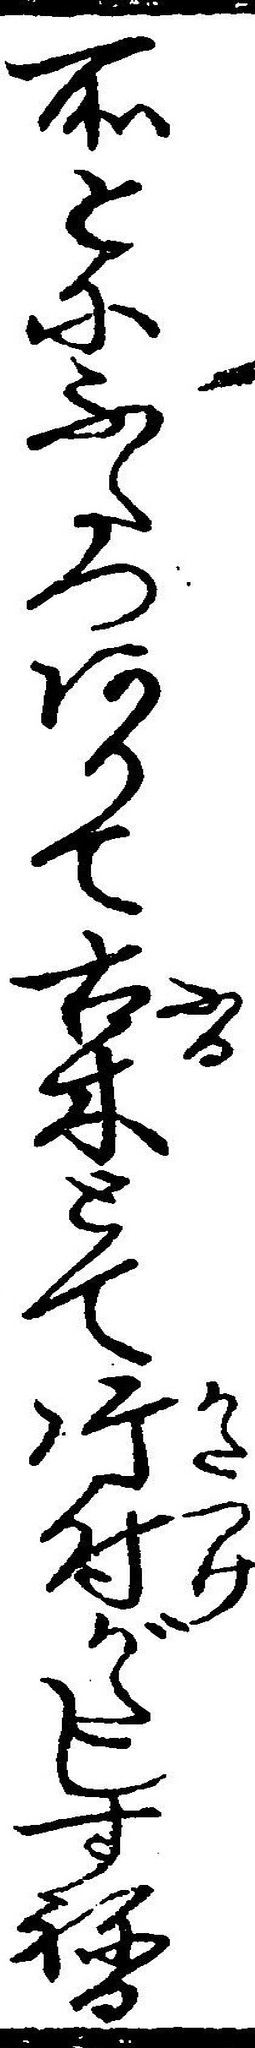所とにふたつありて古木とて片付がたしすねる
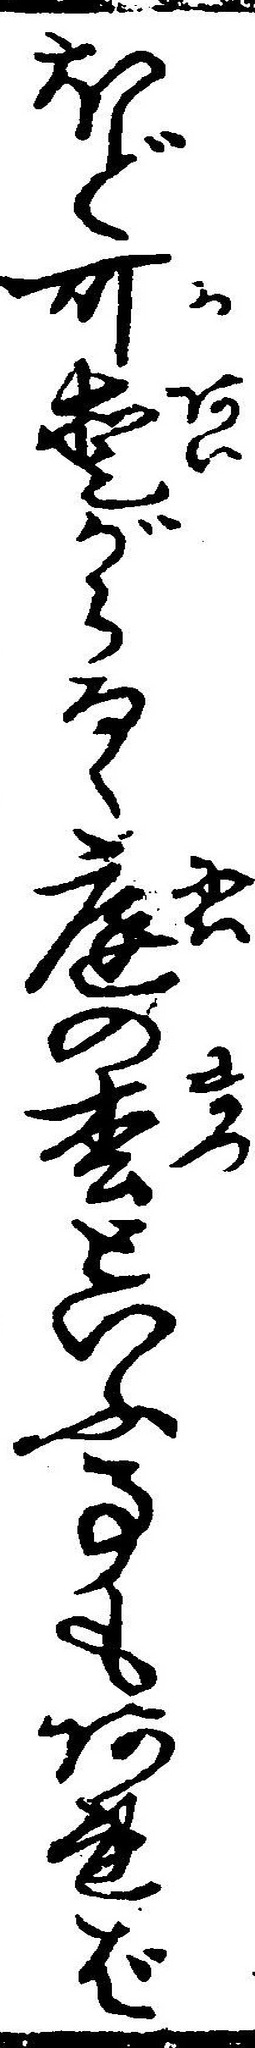ほど可愛がらるゝ庭の松といふ事もあれば
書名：草木芝居化物退治 / 泉花堂三蝶(十六兵衛)作
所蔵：東京大学総合図書館 General Library in the University of Tokyo, JAPAN
